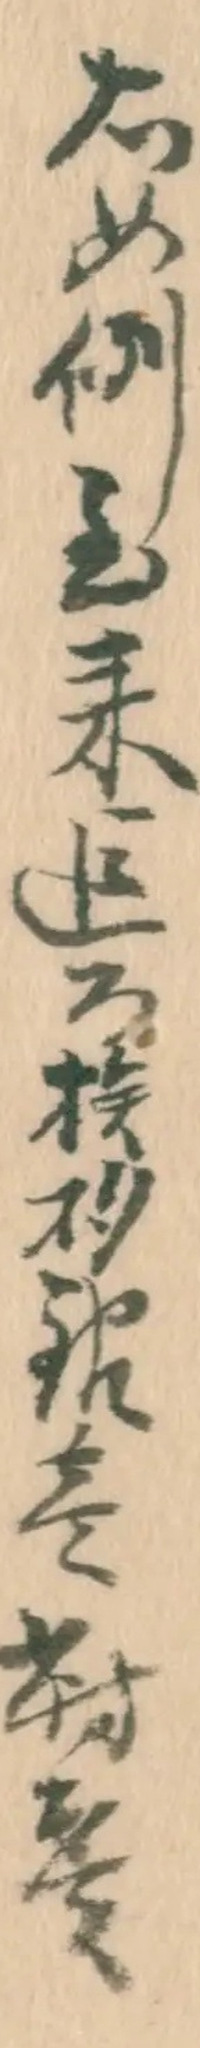右如例到来追而挨拶銀壱封遣ス
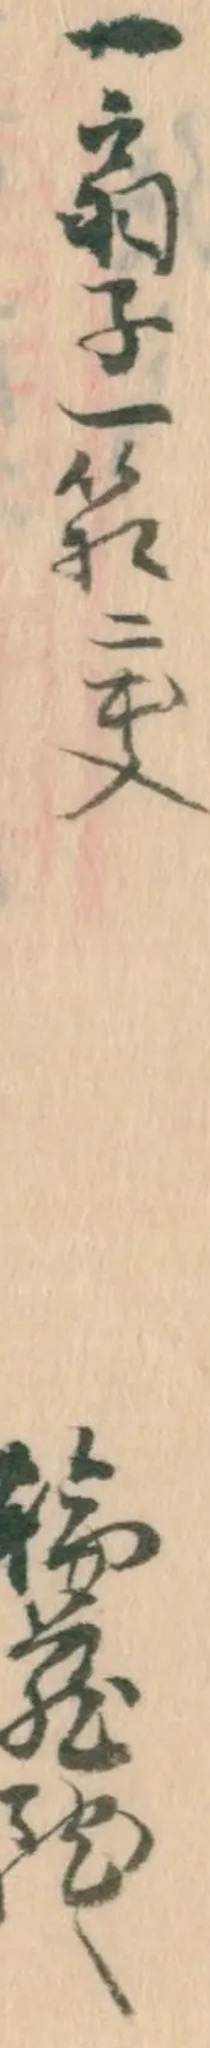一扇子一箱二本入輪蔵院へ
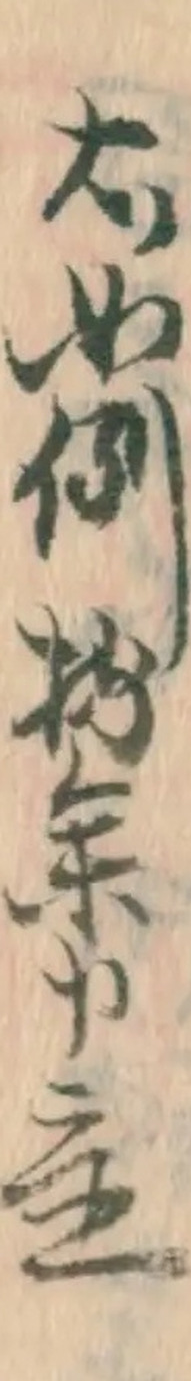右如例持参申置
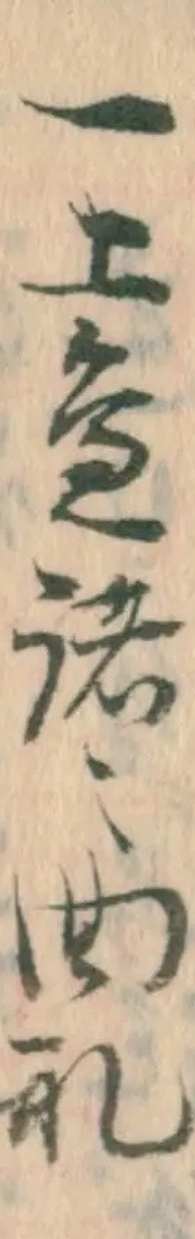一上辺諸々回礼
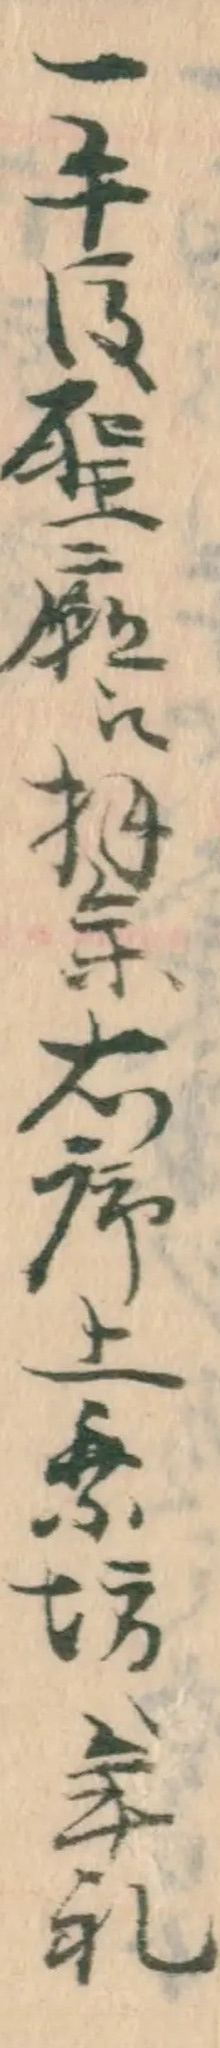一午後聖女廟え拝参右席上乗坊へ年礼
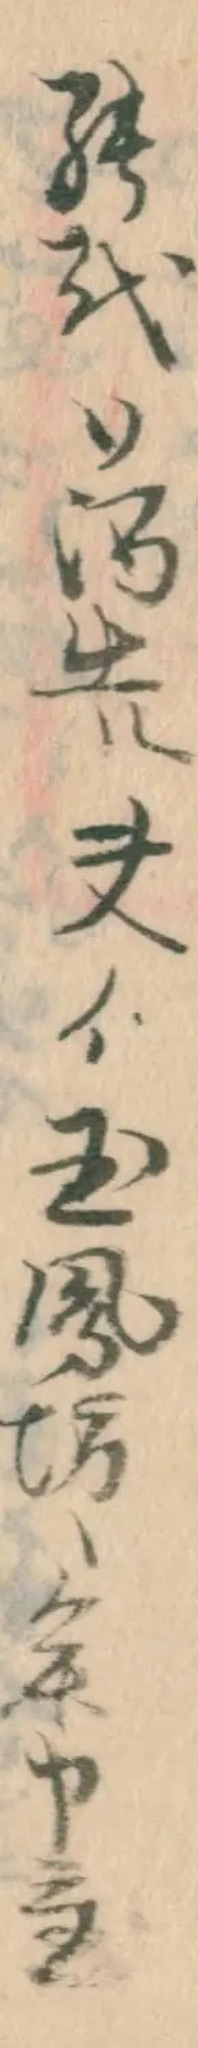罷越御酒出ル夫ゟ玉鳳坊へ参申置
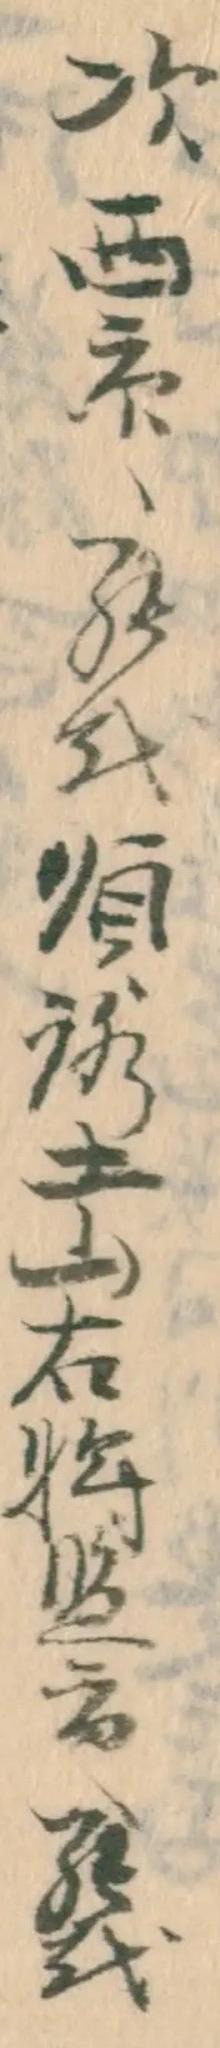次西京へ罷越順路土山右将監方へ罷越
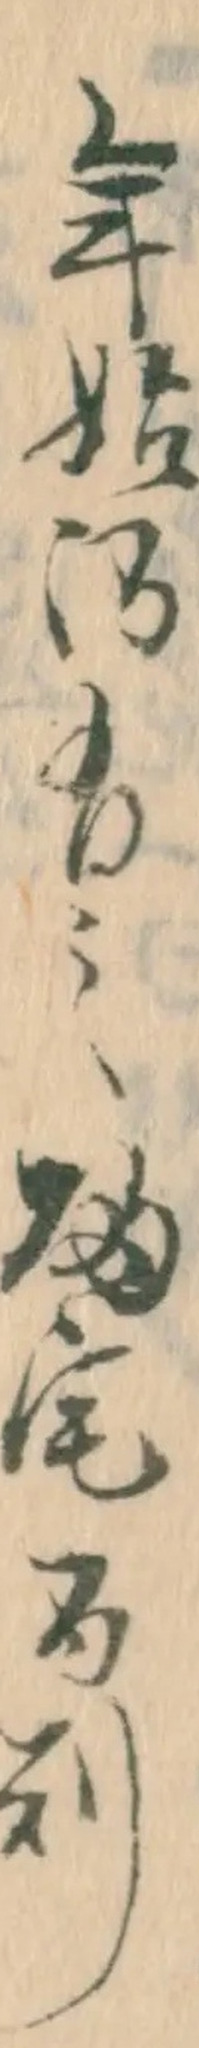年始酒有之帰宅酉刻
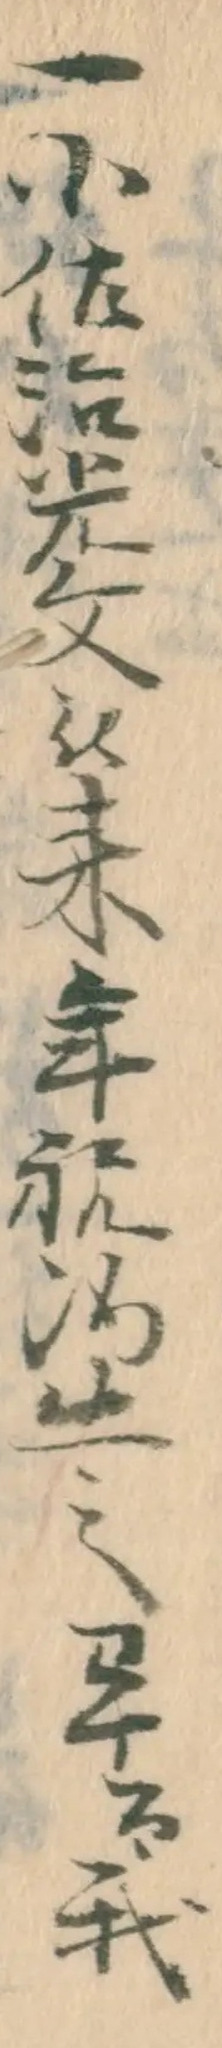一小佐治光文被来年祝酒出之畢而我
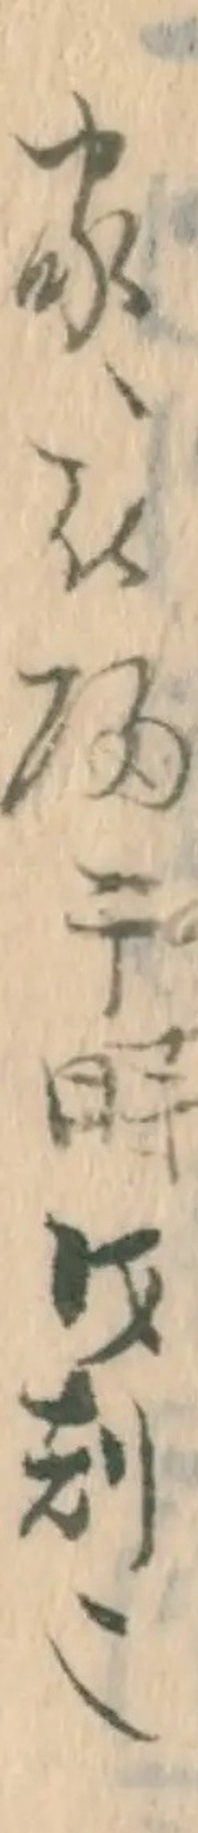家へ被帰于時戌刻也
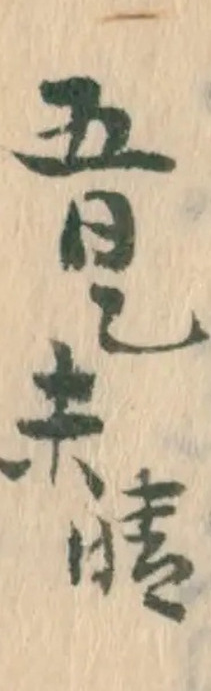五日乙未晴
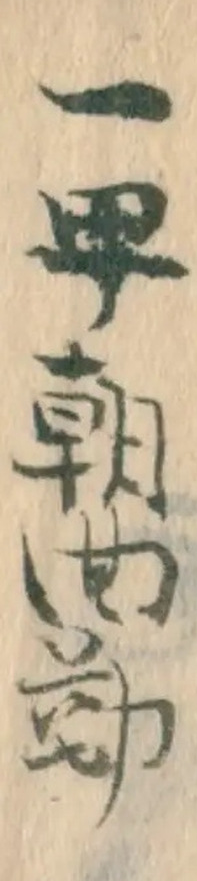一早朝回勤
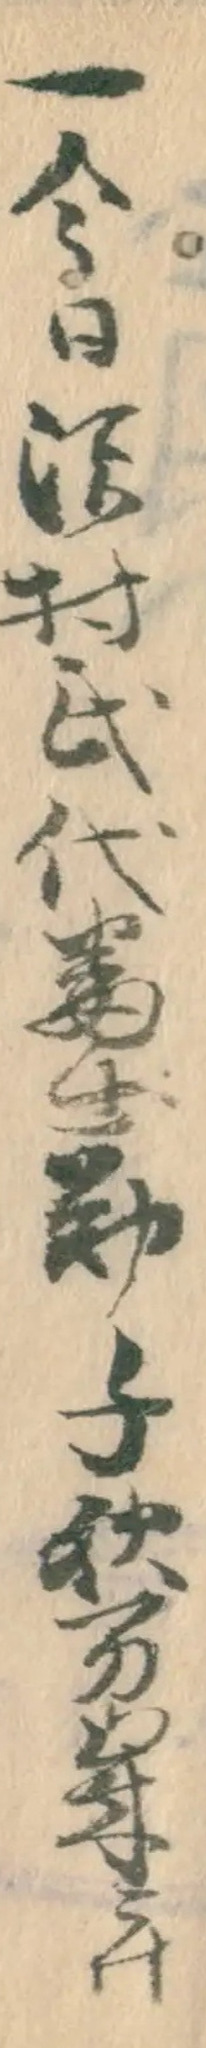一今日沢村氏代番出勤千秋万歳ニ付
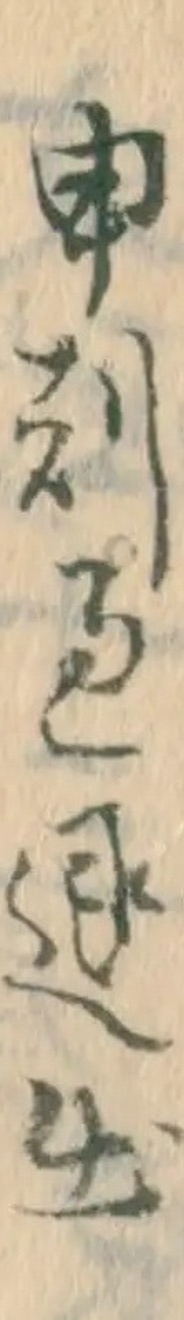申刻過退出

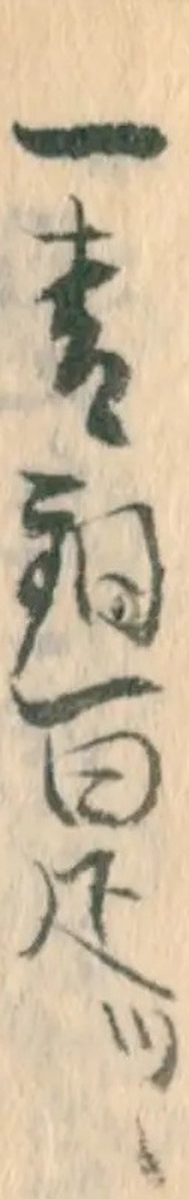一青銅百疋ツヽ
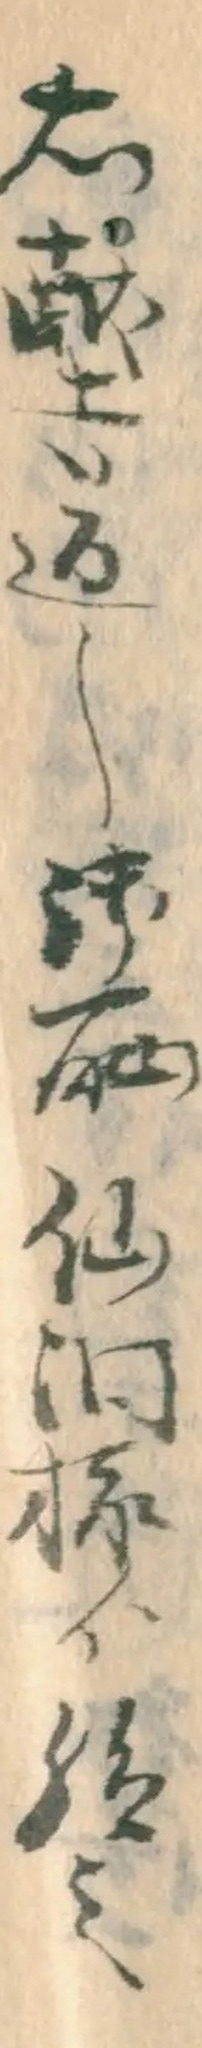右献上御返し御所仙洞様ゟ給之
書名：禁裏御所御用日記. [131]
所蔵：国立国会図書館 National Diet Library, JAPAN
